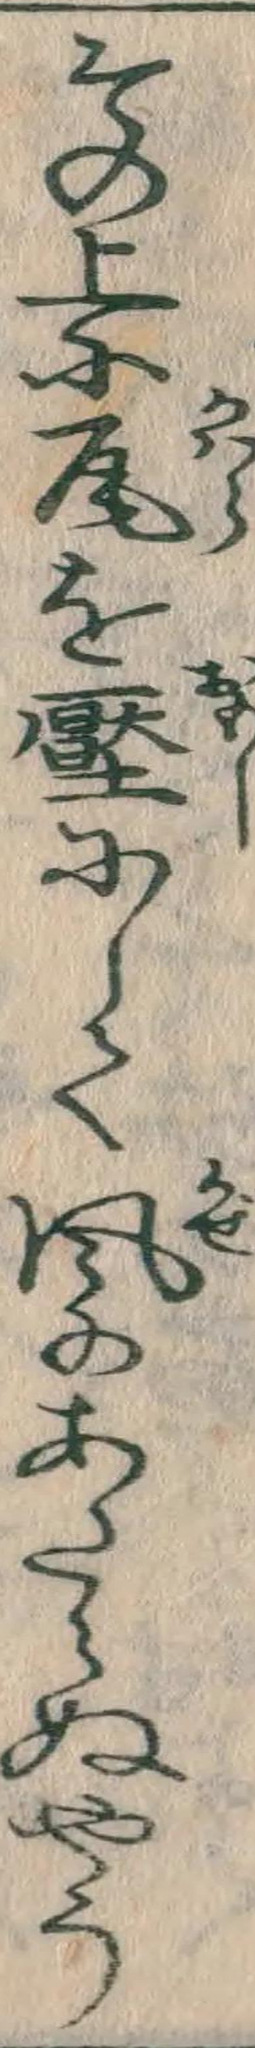その上に瓦を壓にして風のあたらぬやう
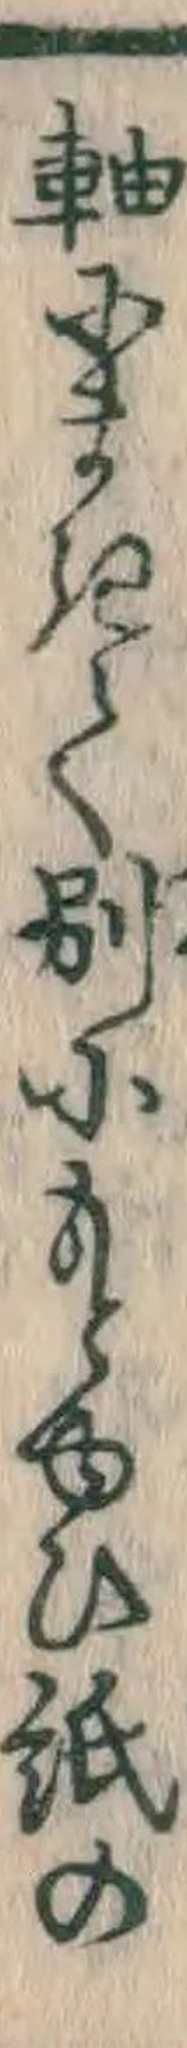軸にまきて別にもとゆひ紙の
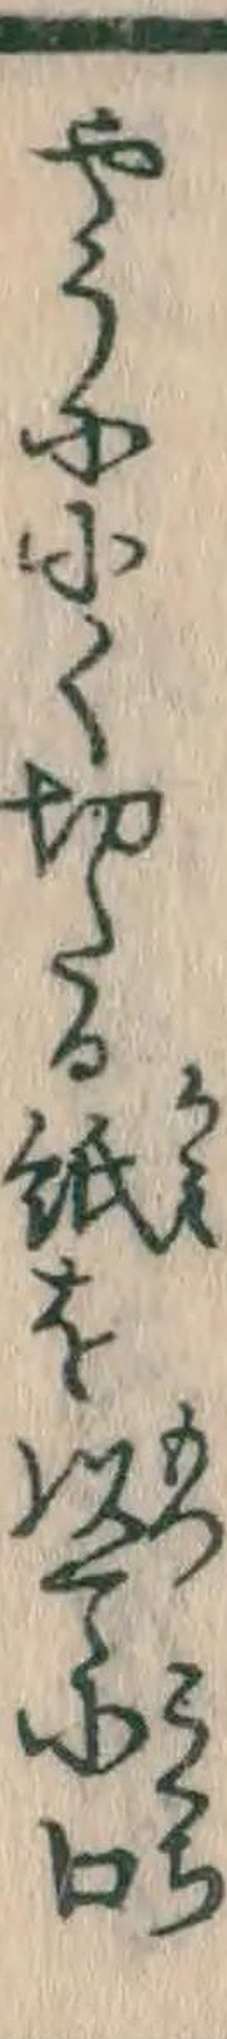やうに小く切たる紙を以て小口
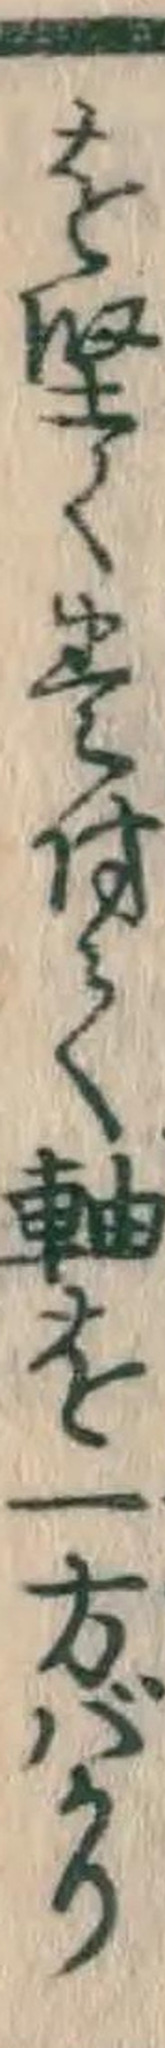を堅く巻付て軸を一方ばかり
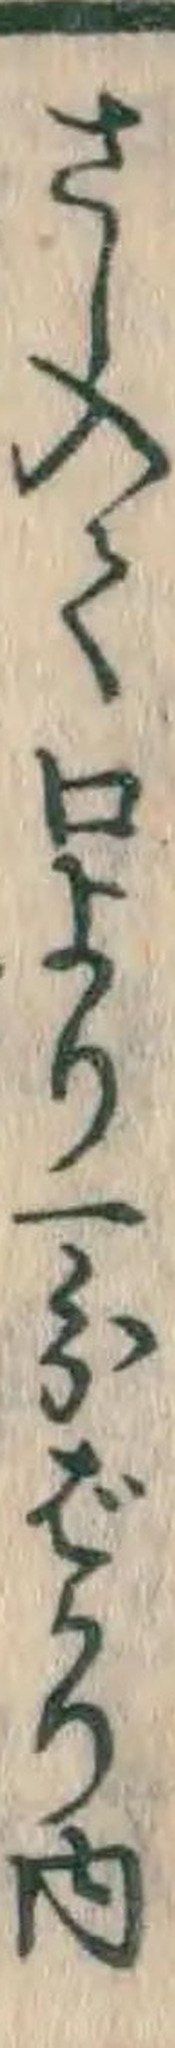さし入て口より一分ばかり内
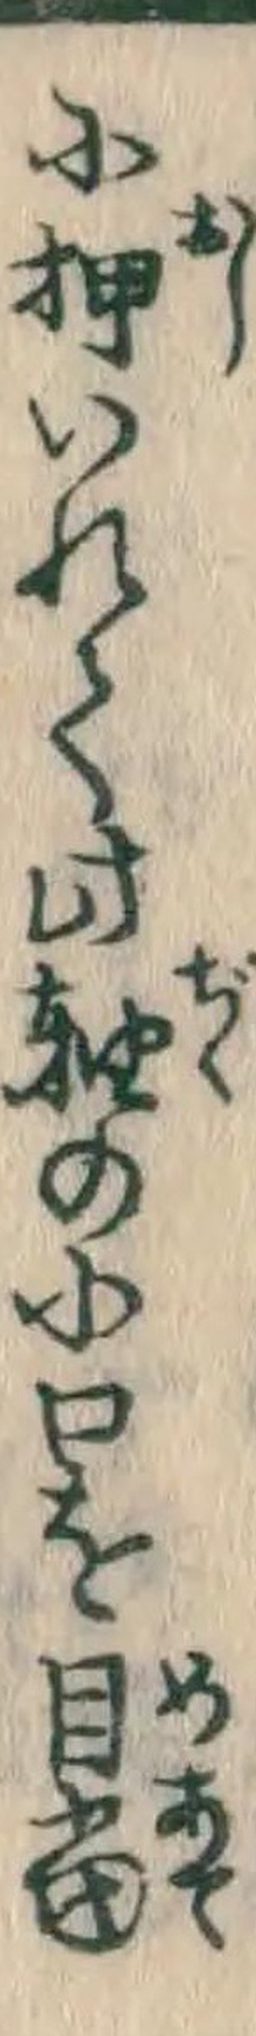に押いれて此軸の小口を目当
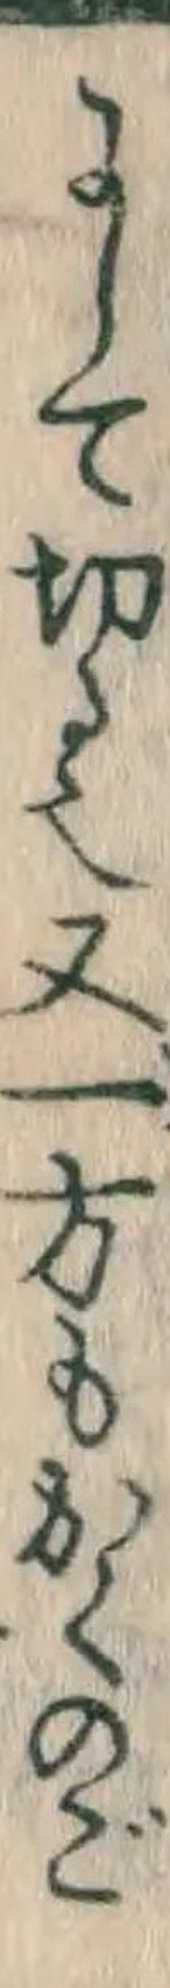にして切る也又一方もかくのご
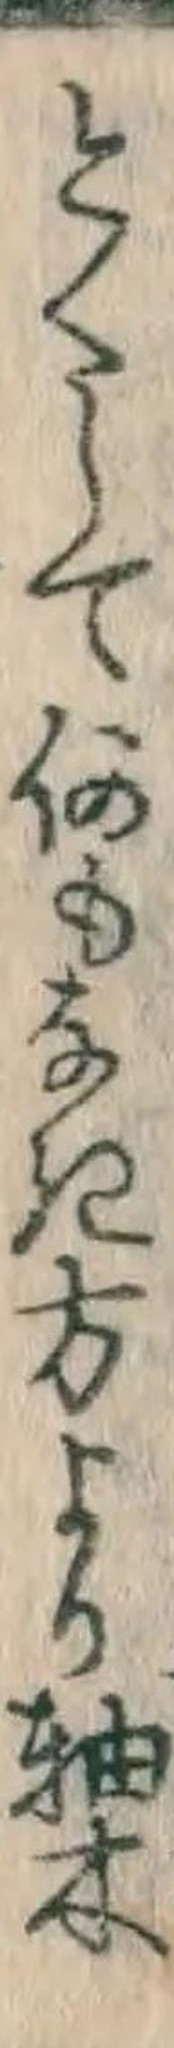とくして何もなき方より軸木
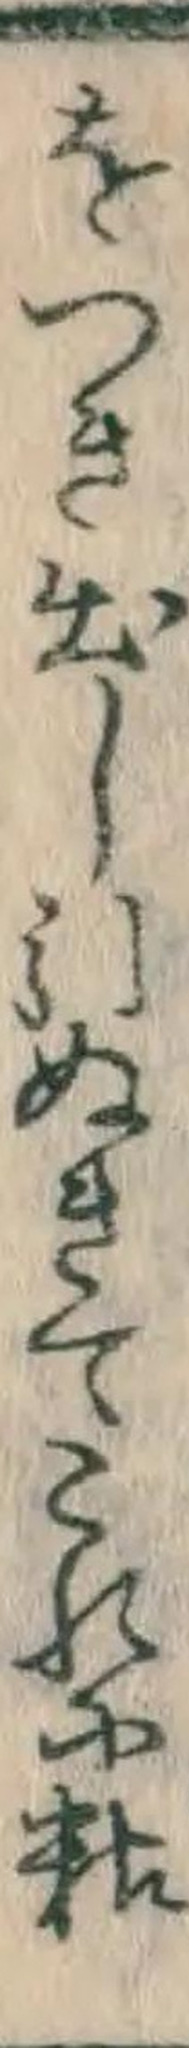をつき出し引ぬきてこれに粘
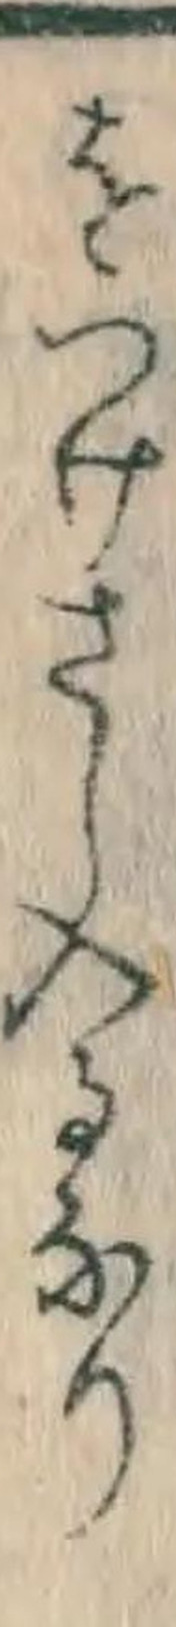をつけさし入るなり
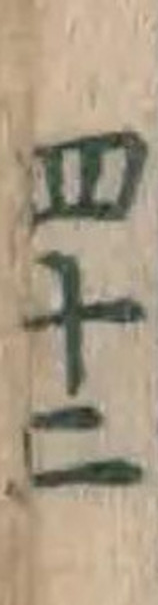四十二

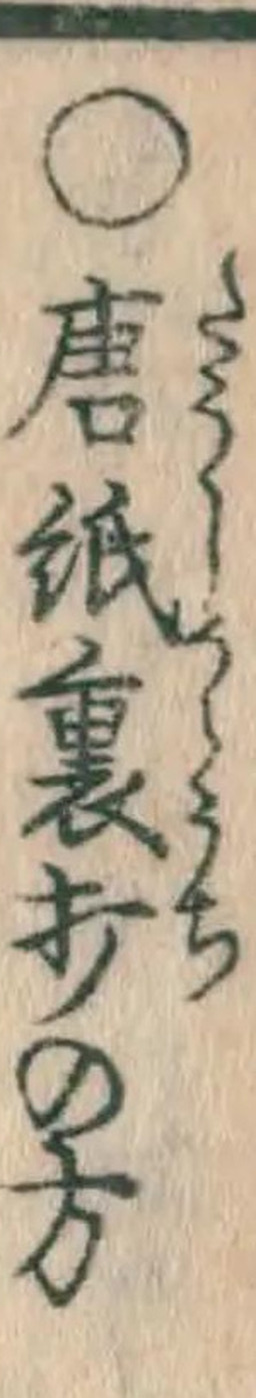○唐紙裏打の方
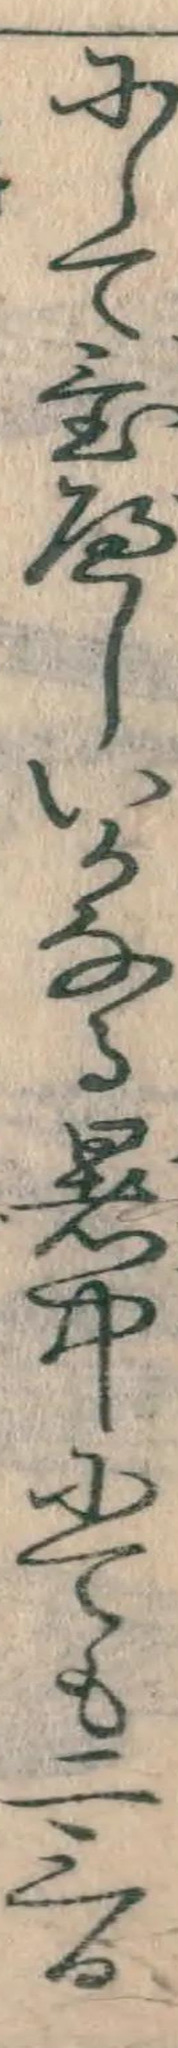にして置べしいかなる暑中にても二三日
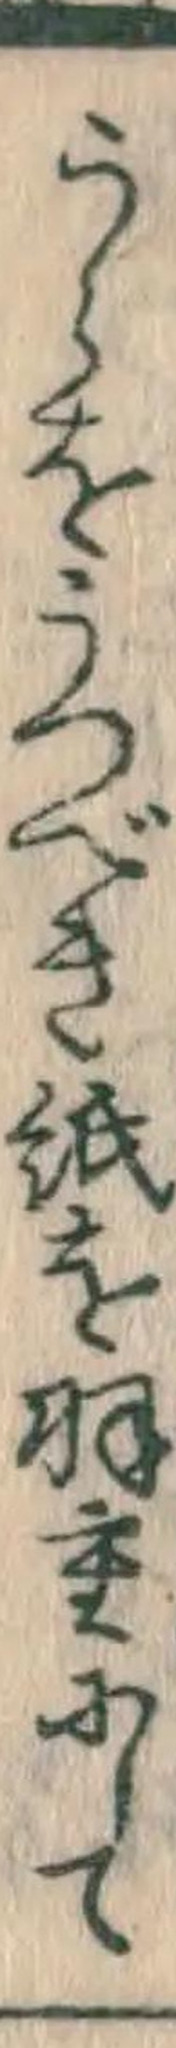うらをうつべき紙を羽重にして
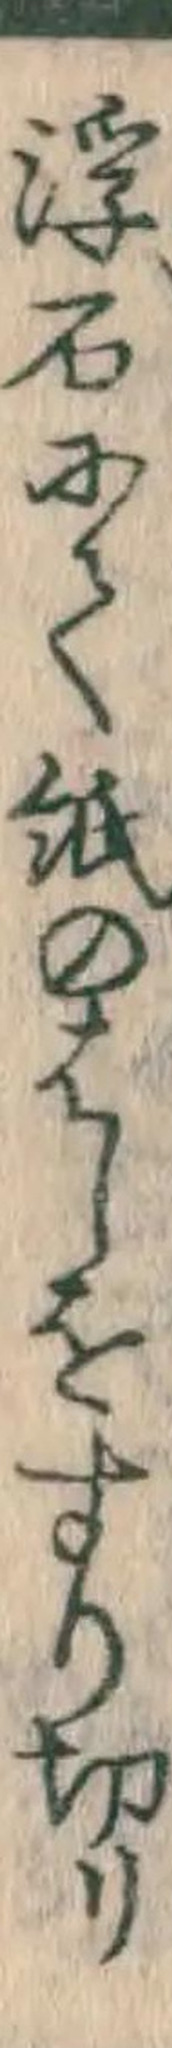浮石にて紙のはしをすり切り
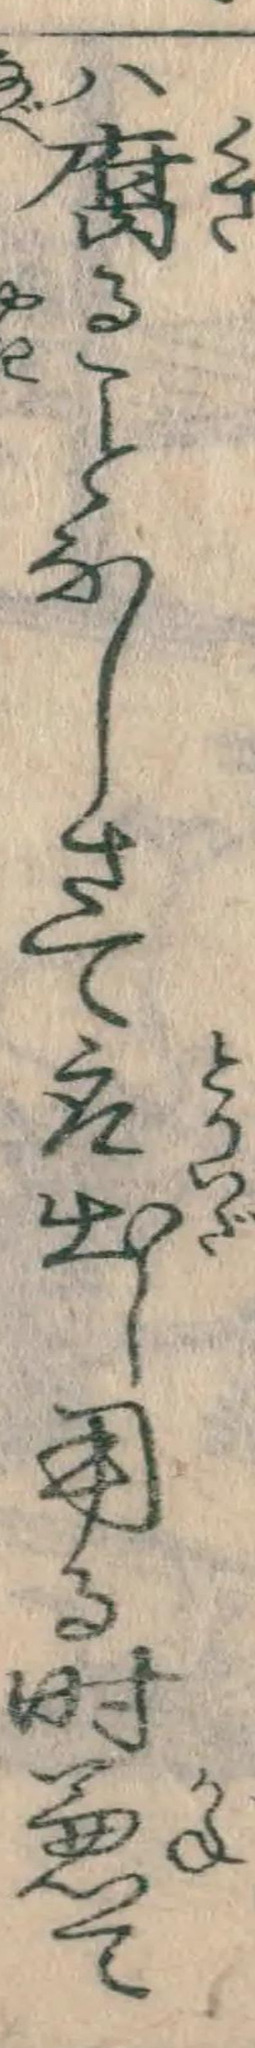は腐ることなしさて取出し用る時兼て
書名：広益秘事大全 3巻. [2]
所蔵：国立国会図書館 National Diet Library, JAPAN
